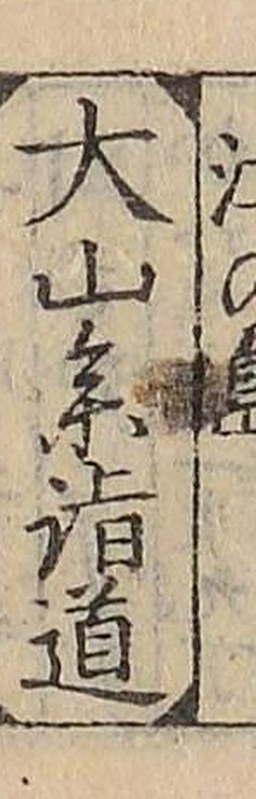大山参詣道
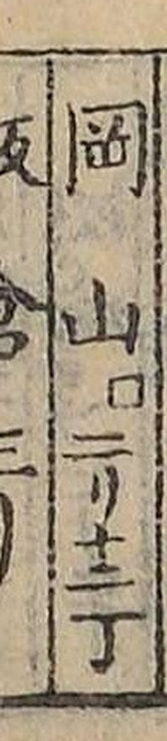岡山▫二リ十二丁
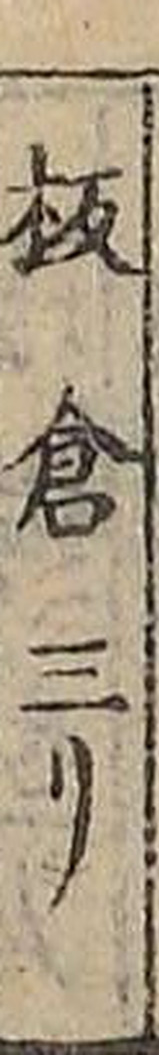板倉三リ
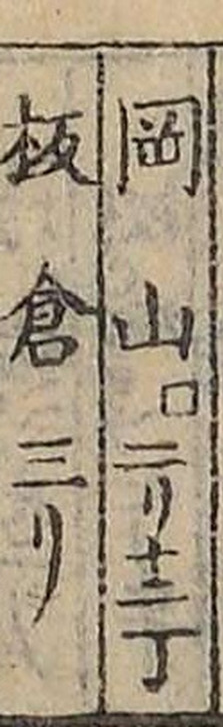のふ二リ十二丁
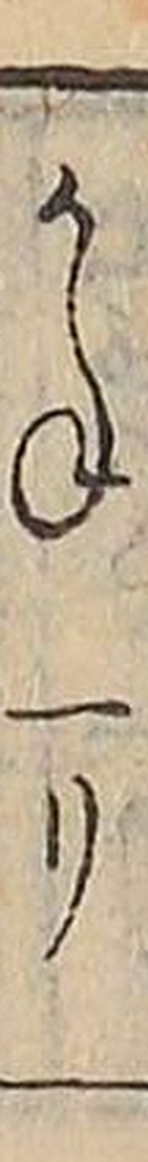かね一リ
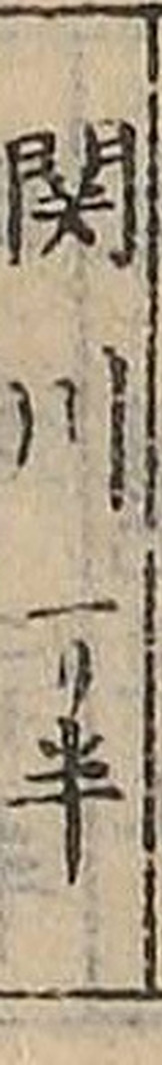関川一リ半
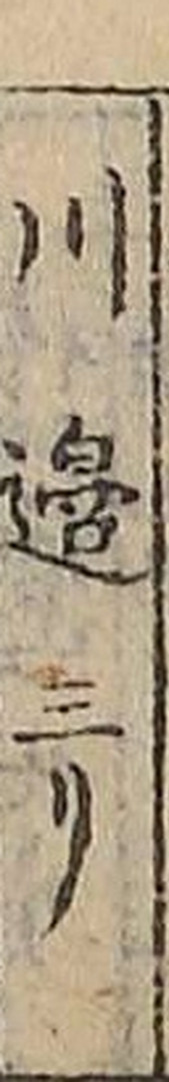川辺三リ
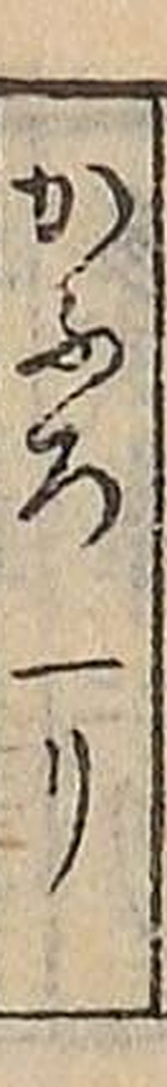かふろ一リ
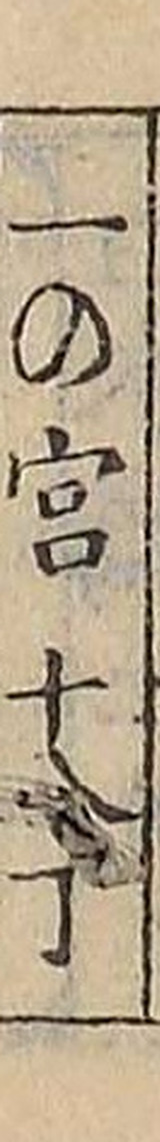一の宮十八丁
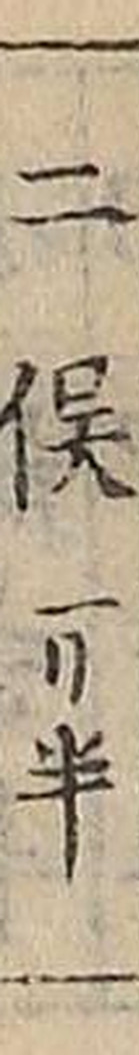二俣一リ半
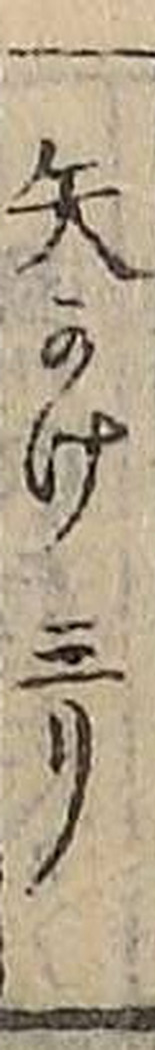矢かけ三リ
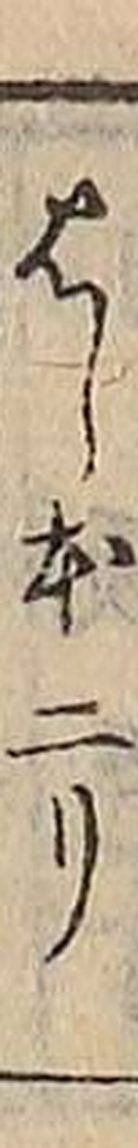はし本二リ
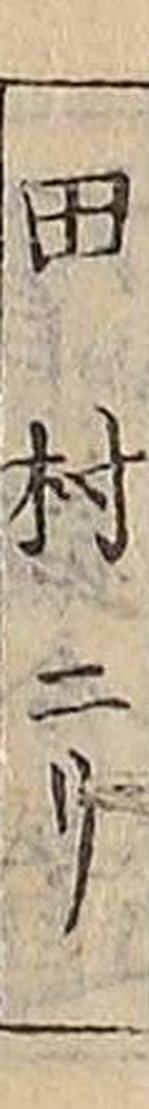田村二リ
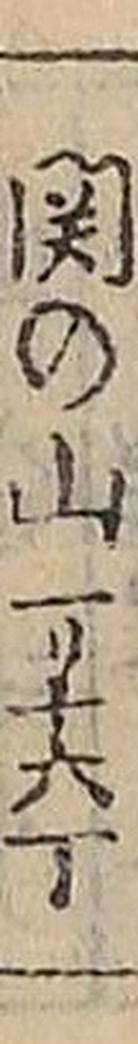関の山一リ十六丁
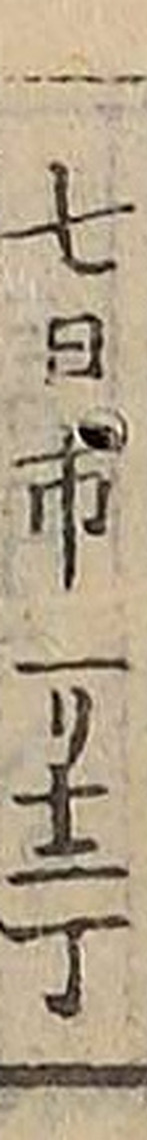七日市一リ十二丁
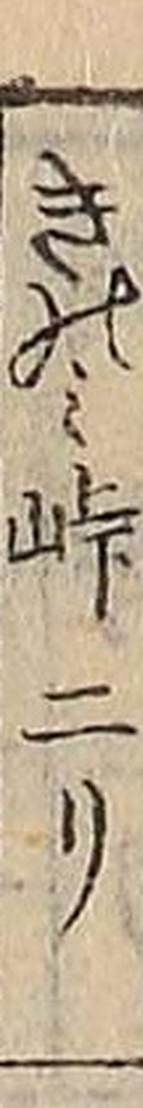きのみ峠二リ
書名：旅行用心集
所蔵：神戸大学附属図書館 国文学研究資料館
